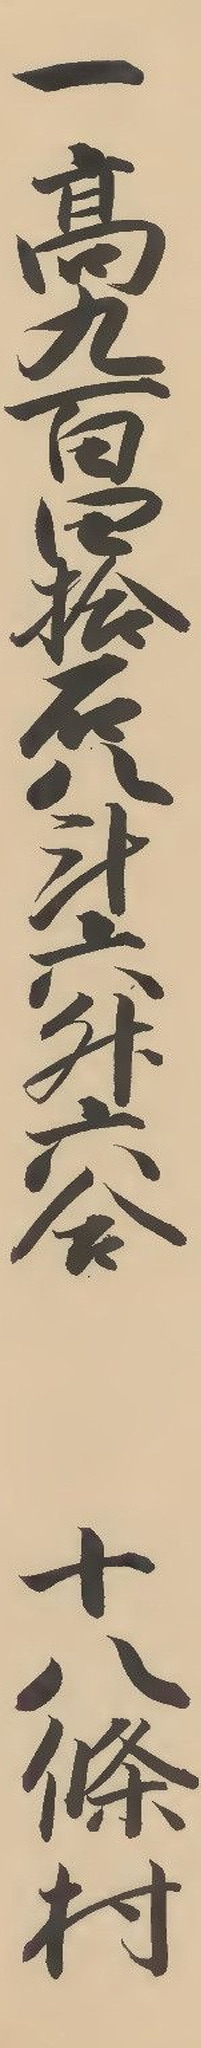一高九百四拾石八斗六升六合十八条村

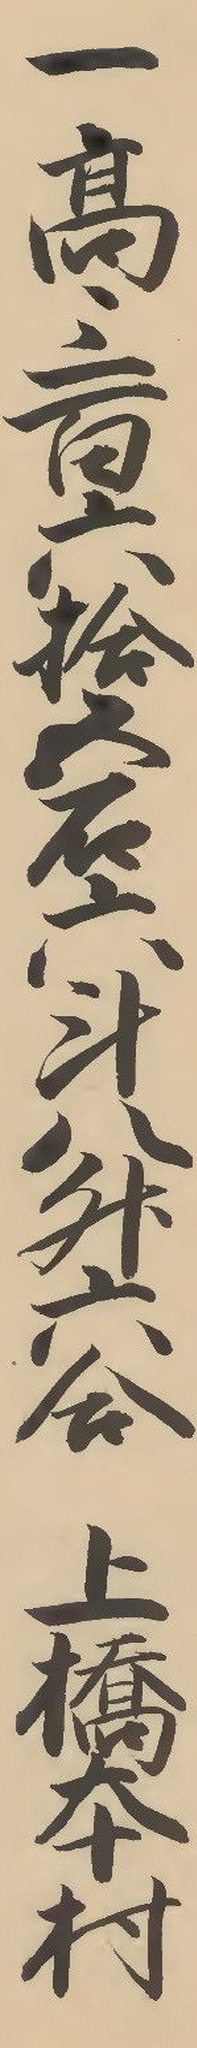一高三百六拾五石六斗八升六合上橋本村
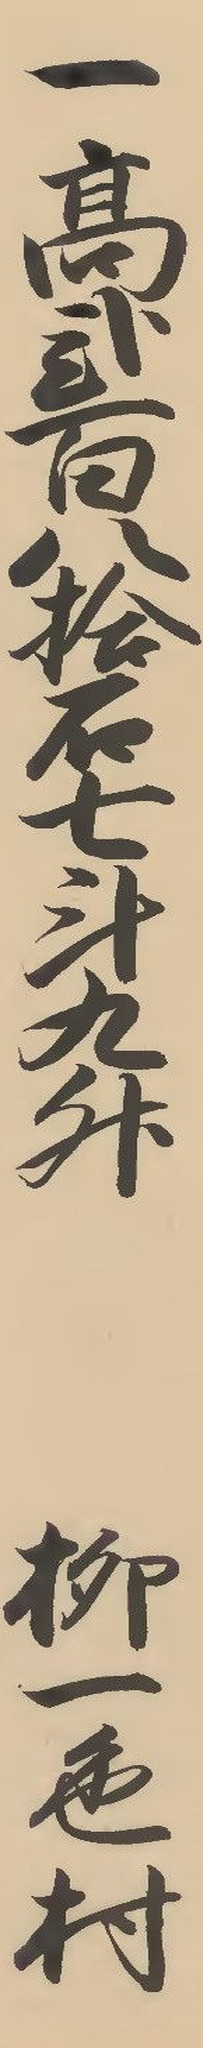一高弐百八拾石七斗九升柳一色村
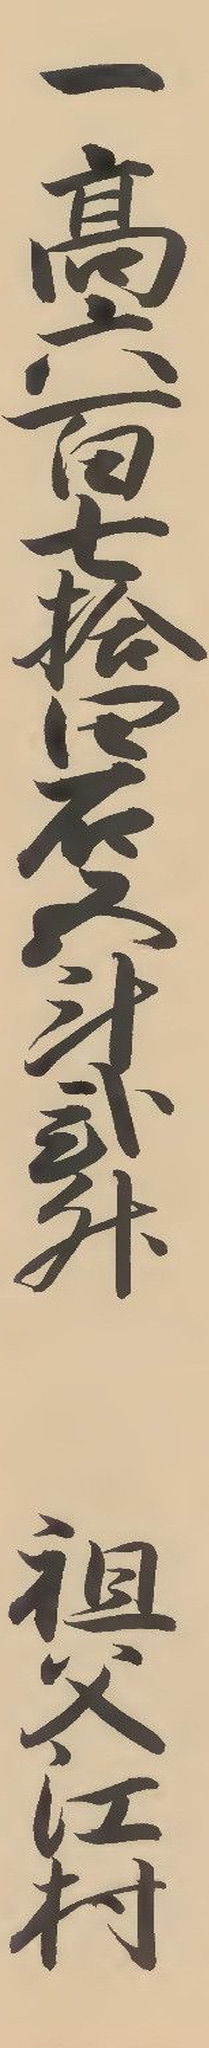一高六百七拾四石五斗弐升祖父江村
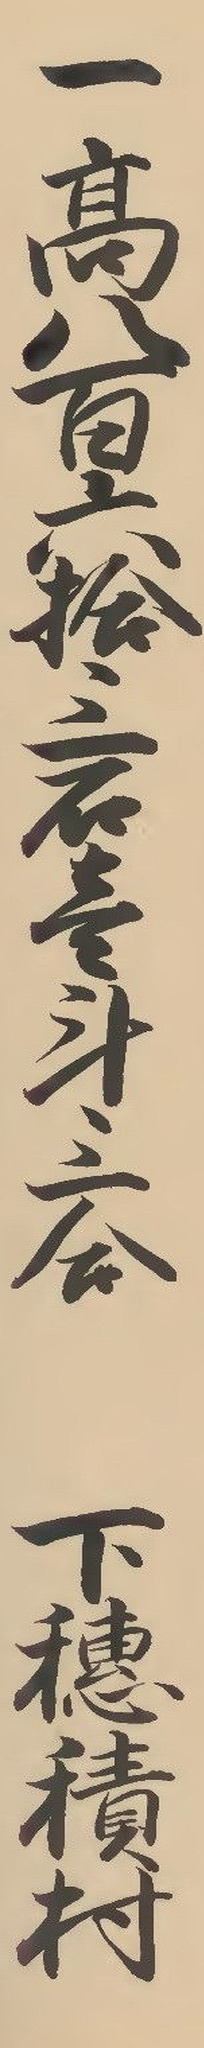一高八百六拾三石壱斗三合下穂積村
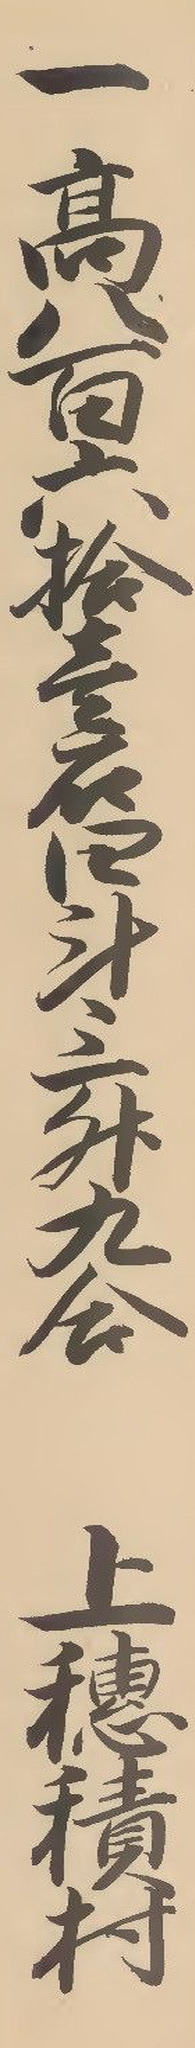一高八百六拾壱石四斗三升九合上穂積村
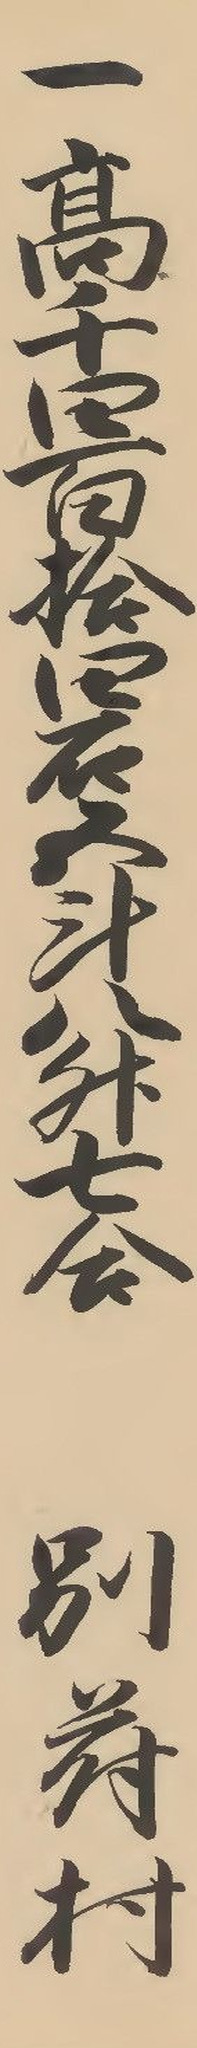一高千四百拾四石五斗八升七合別符村
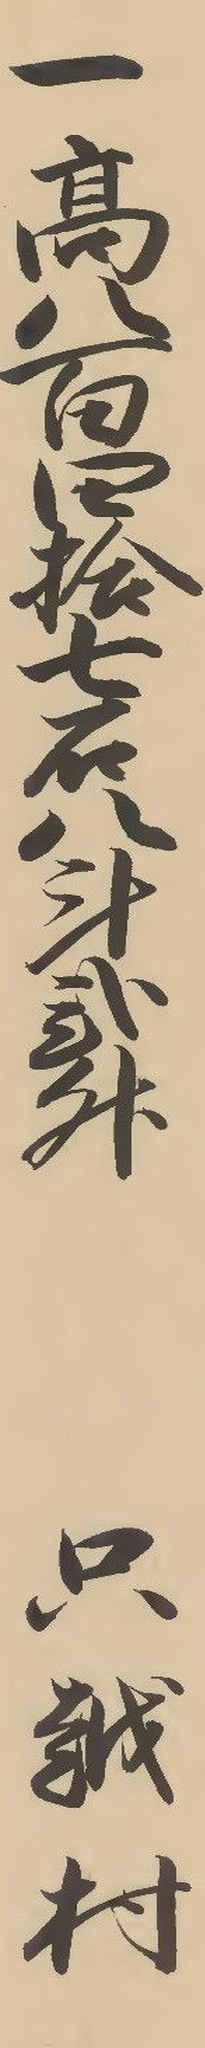一高八百四拾七石八斗弐升只越村
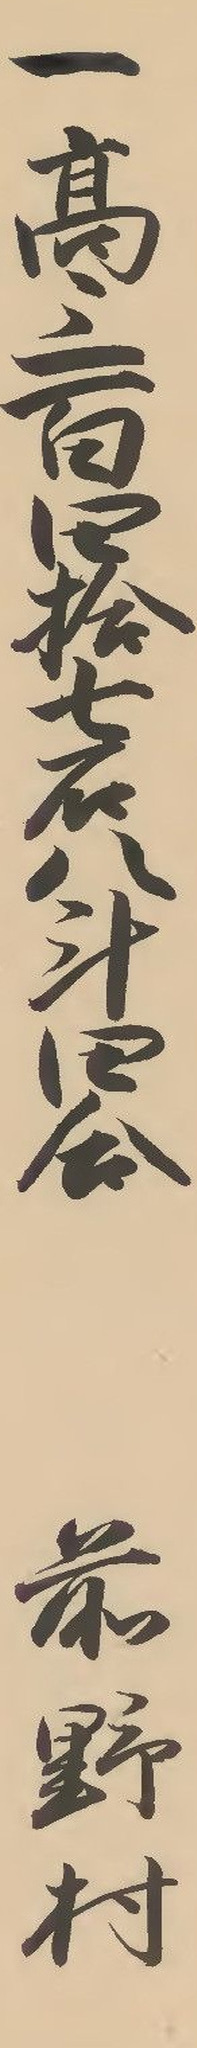一高三百四拾七石八斗四合前野村

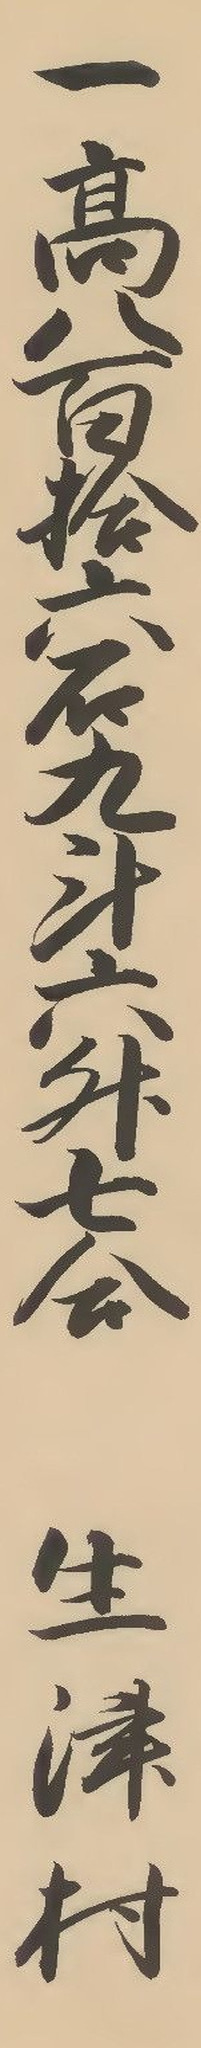一高八百拾六石九斗六升七合生津村
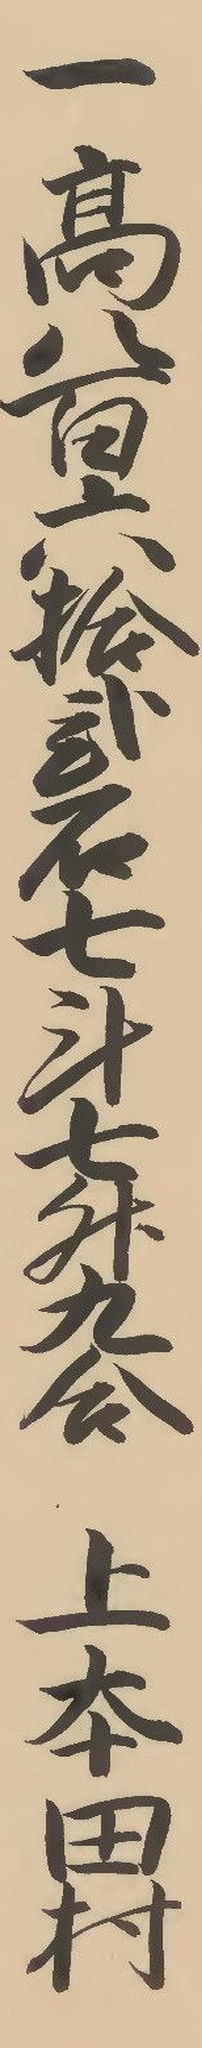一高八百六拾弐石七斗七升九合上本田村
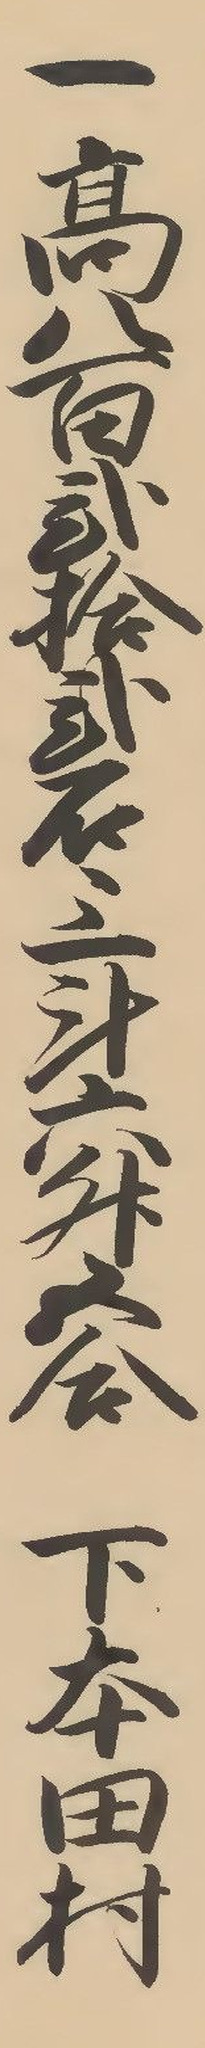一高八百弐拾弐石三斗六升五合下本田村
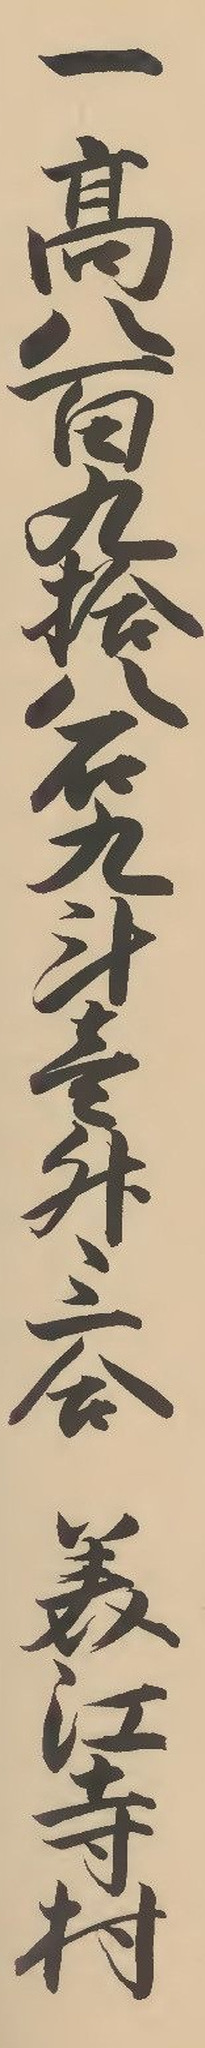一高八百九拾八石九斗壱升三合美江寺村
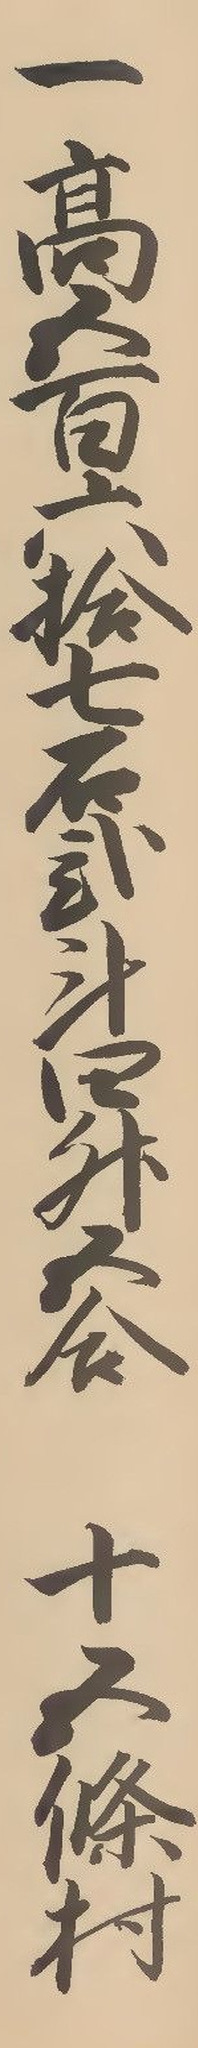一高五百六拾七石弐斗四升五合十五条村
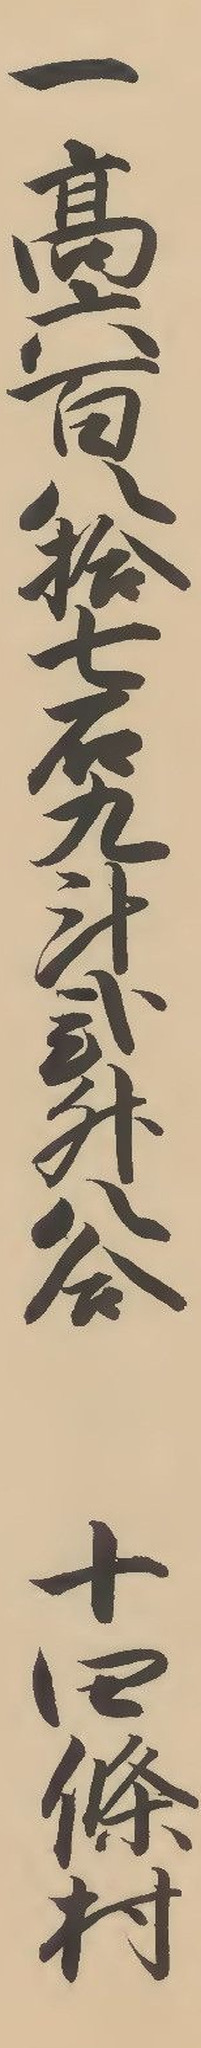一高六百八拾七石九斗弐升八合十四条村
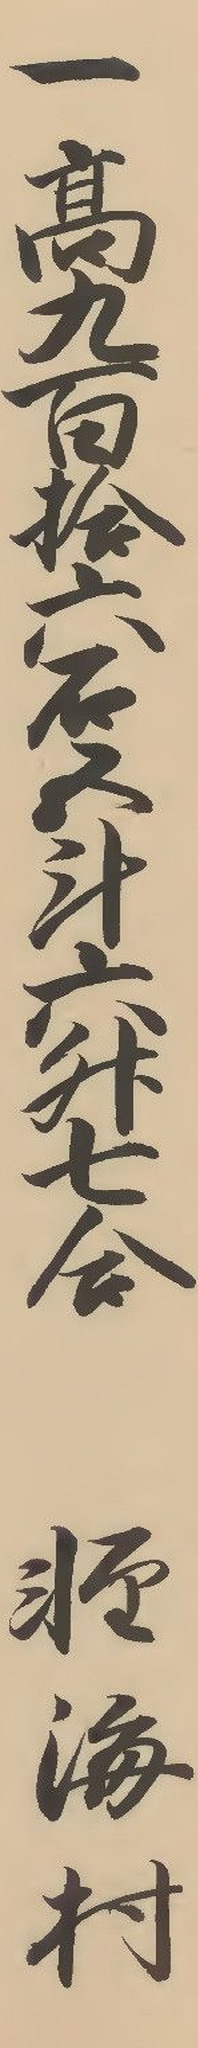一高九百拾六石五斗六升七合軽海村
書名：美濃国郷帳
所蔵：国立公文書館 National Archives of Japan
